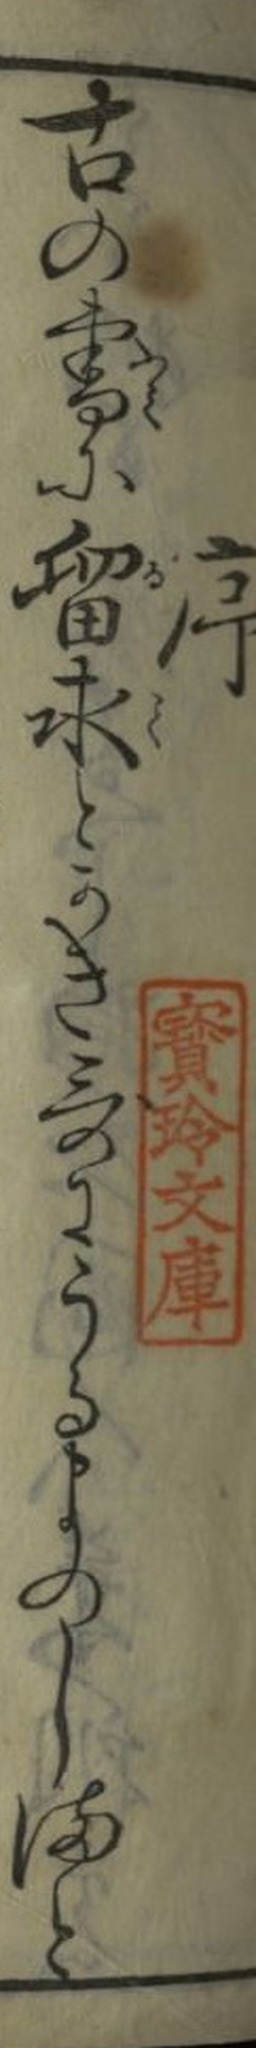古の書に留求とかき哥にうるまのしまと
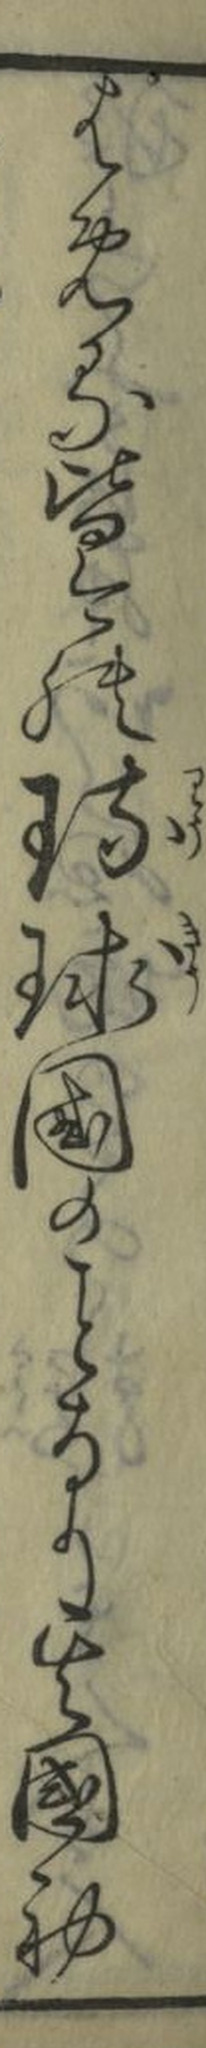よめる皆今の琉球國のことなり其國初
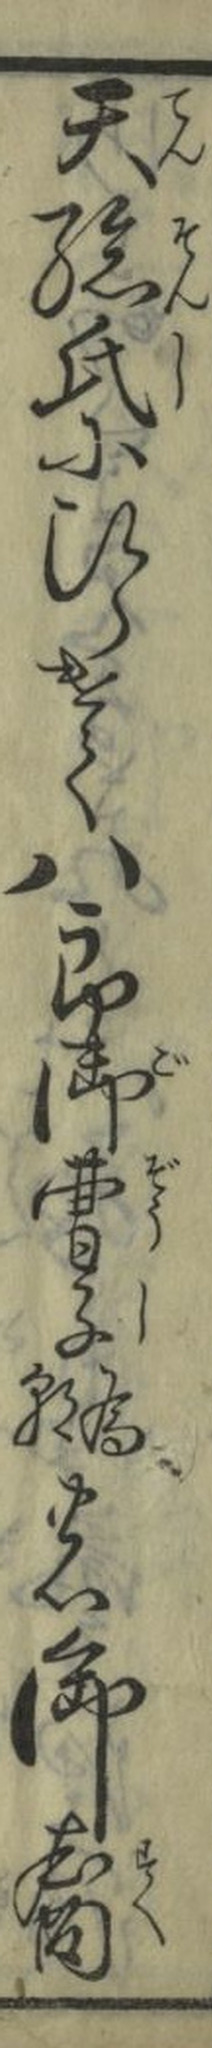天孫氏にひらけて八郎御曹子為朝の御裔
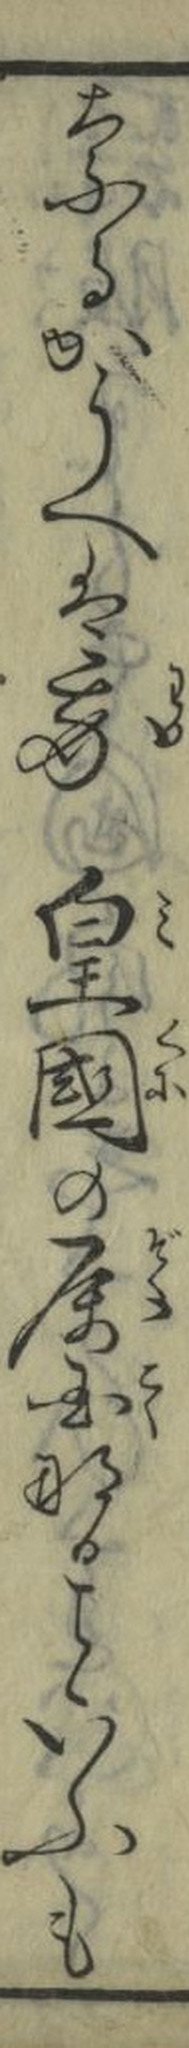なるかうへは我皇國の属国なることいふも
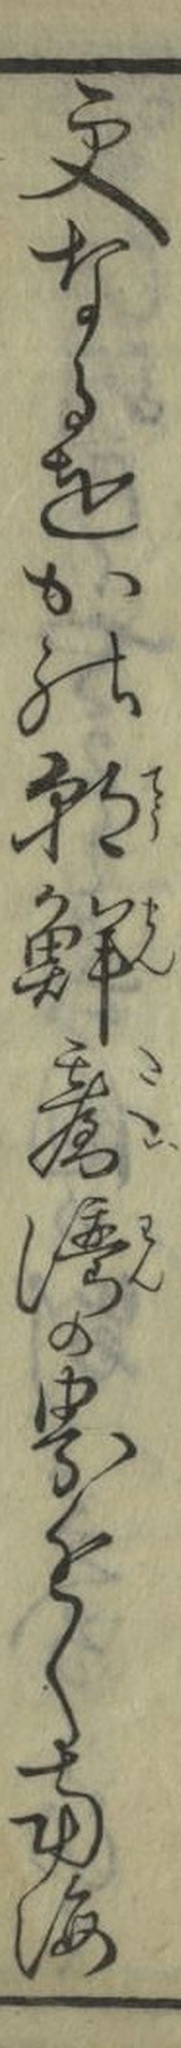更なるをかの朝鮮臺湾の界近く南海
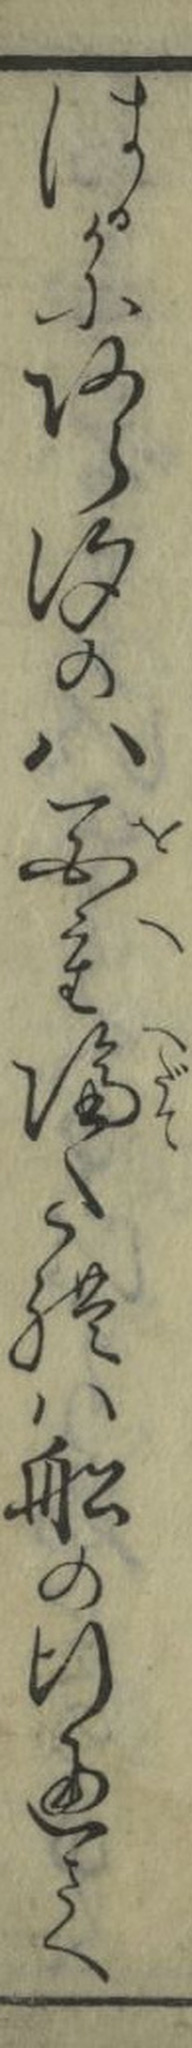はるかにあら汐の八百重隔たれは船の行通さへ

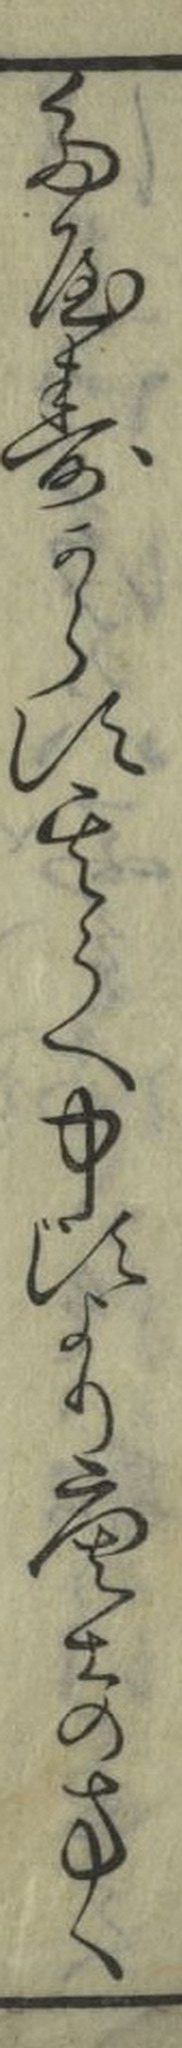たやすからす其うへ中頃より唐土のすく
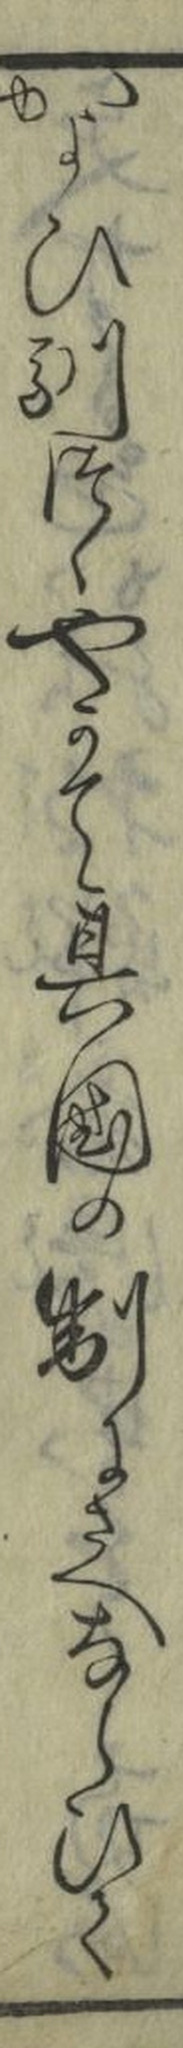かよひ馴つゝやかて其國の制にさへならひて
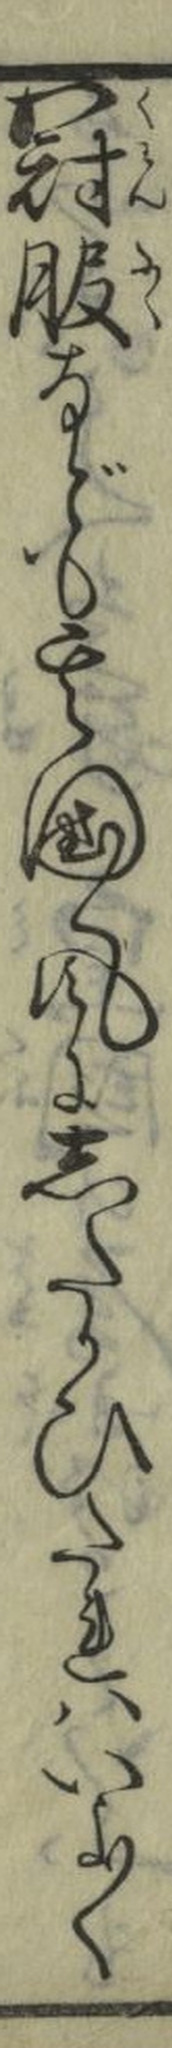冠服なども其國風にしたかひたれはいよ〳〵
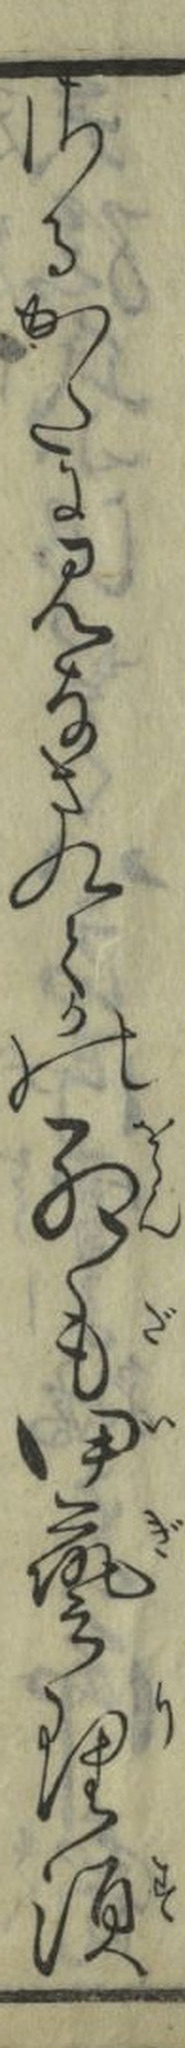さるかたに見なされてかの紅毛伊芸理須
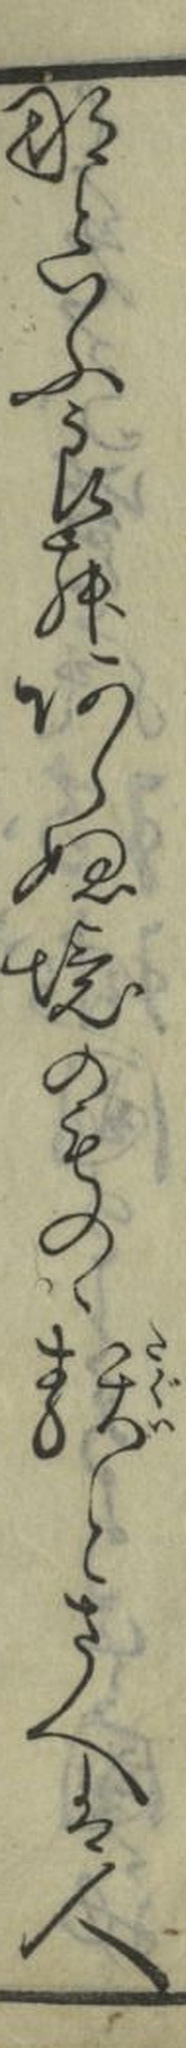なといふらむあらぬ境のものゝ類とさへは人
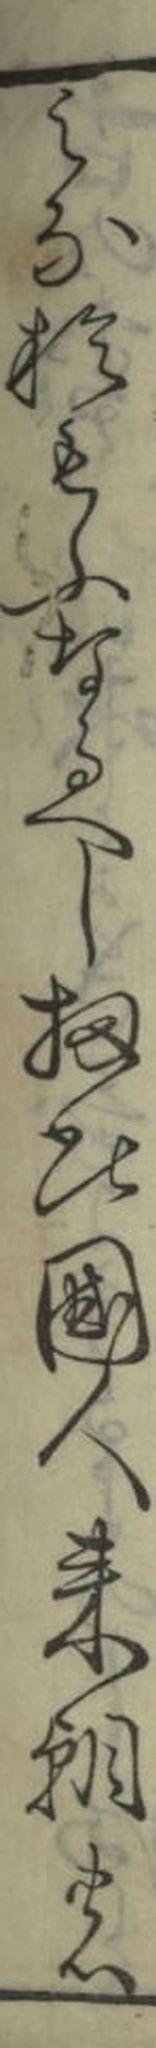みなおもふなるへし扨此國人来朝の
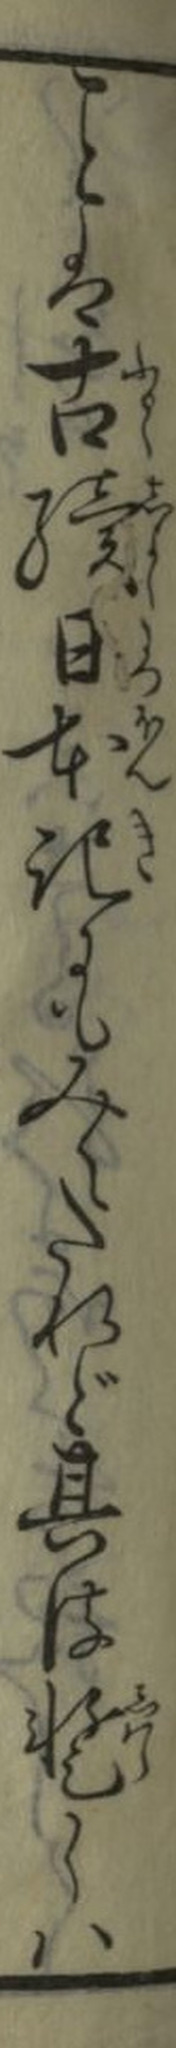ことは古続日本記にもみえたれど其後暫くは
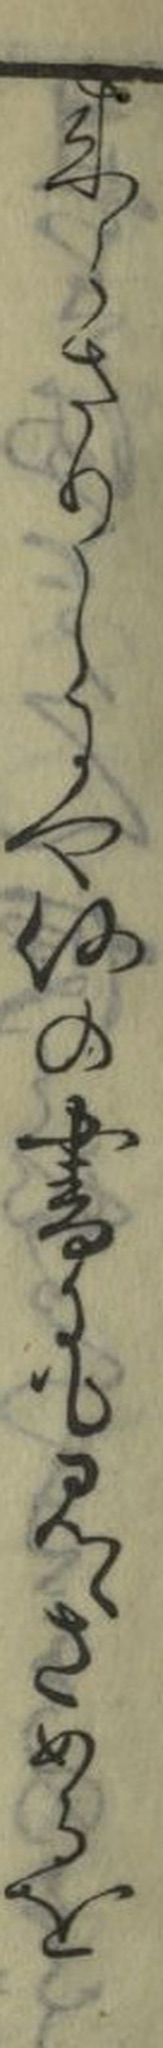来らさりしにや何の書にも見えさめるを
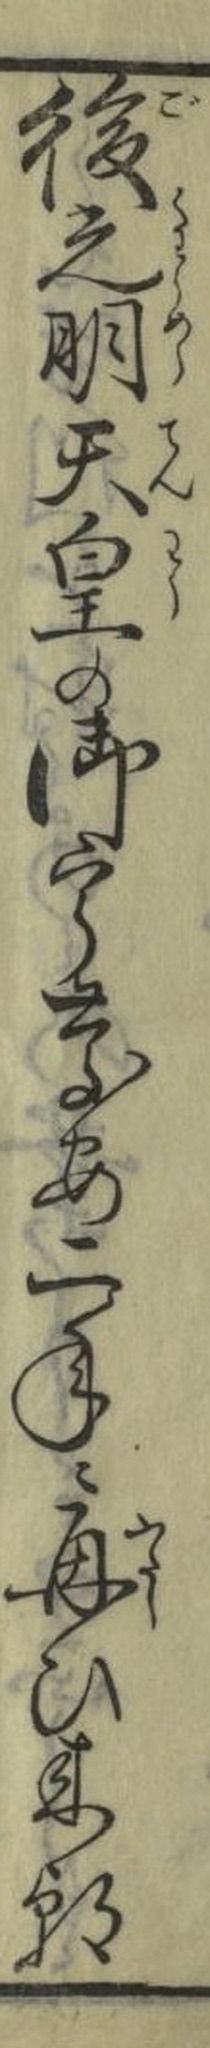後光明天皇の御宇慶安二年に再ひ来朝
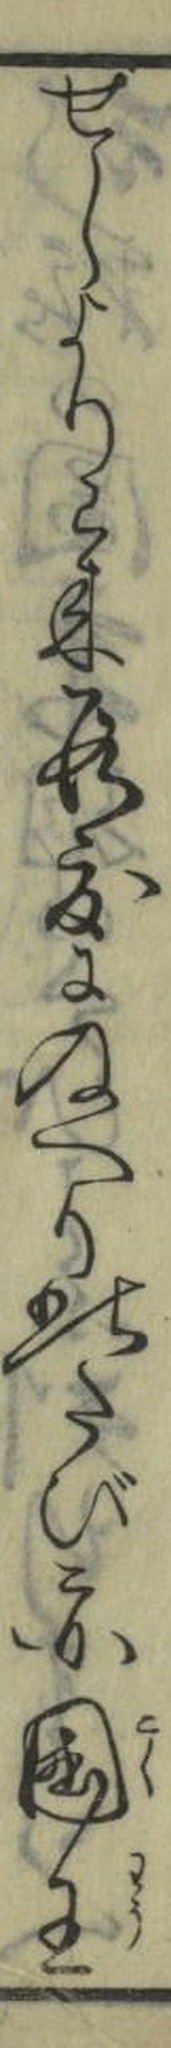せしより已来毎度に及へり此たび亦/国王
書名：新板 琉球人行列記
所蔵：University of the Ryukyus Library
